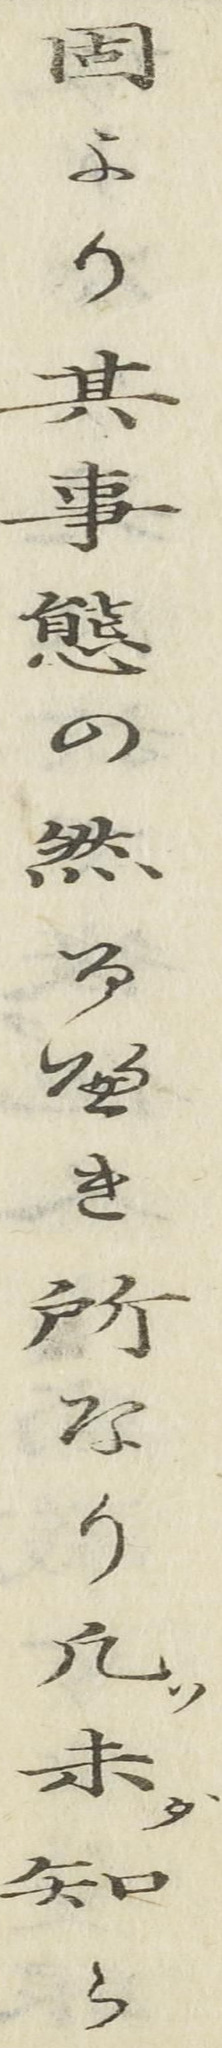固より其事態の然るべき所なり凡そ未だ知ら
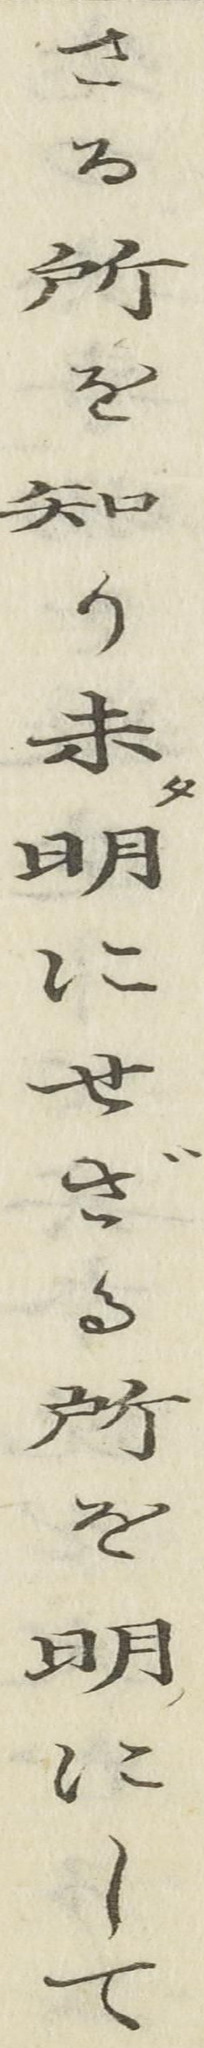さる所を知り未だ明にせざる所を明にして
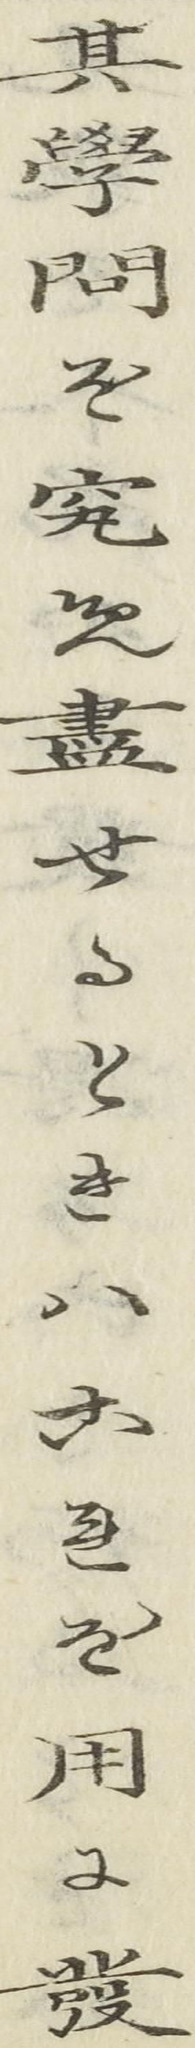其学問を究め尽せるときはこれを用に発
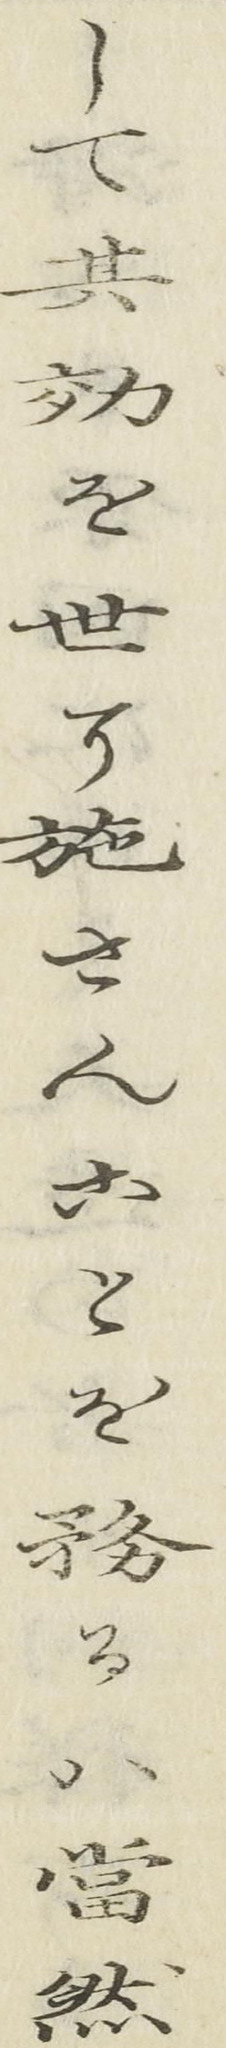して其効を世に施さんことを務るは当然
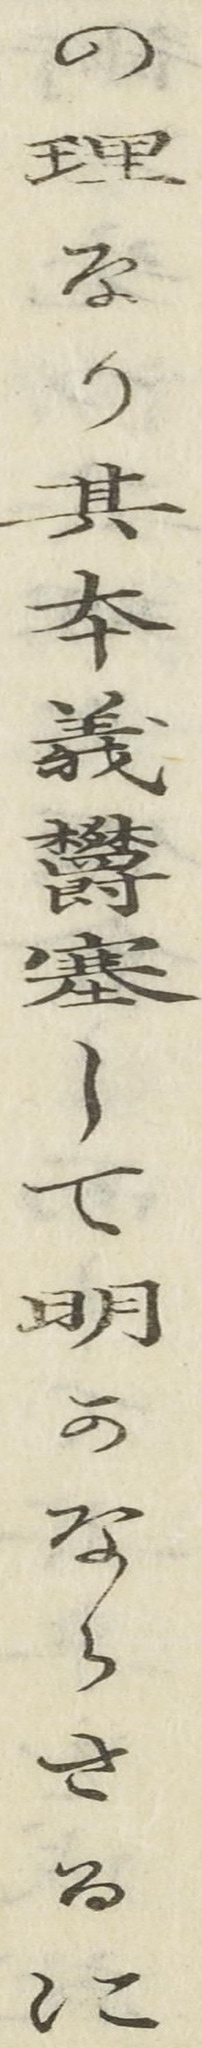のなり理其本義鬱塞して明かならざるに
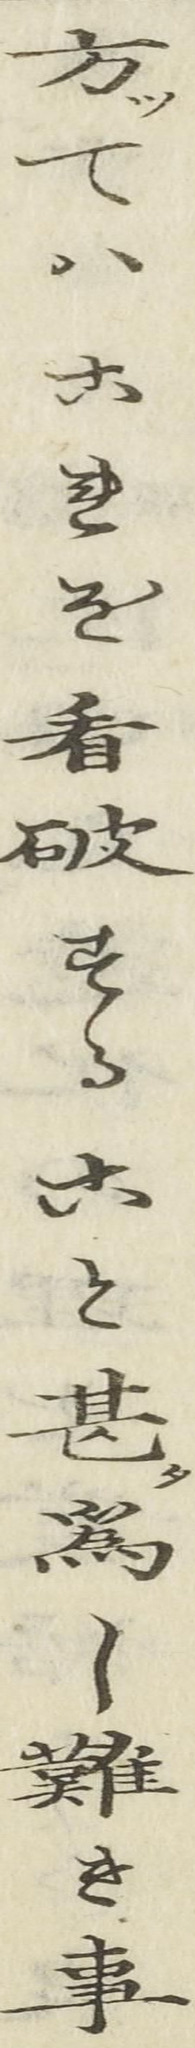方ってはこれを看破すること甚だ為し難き事
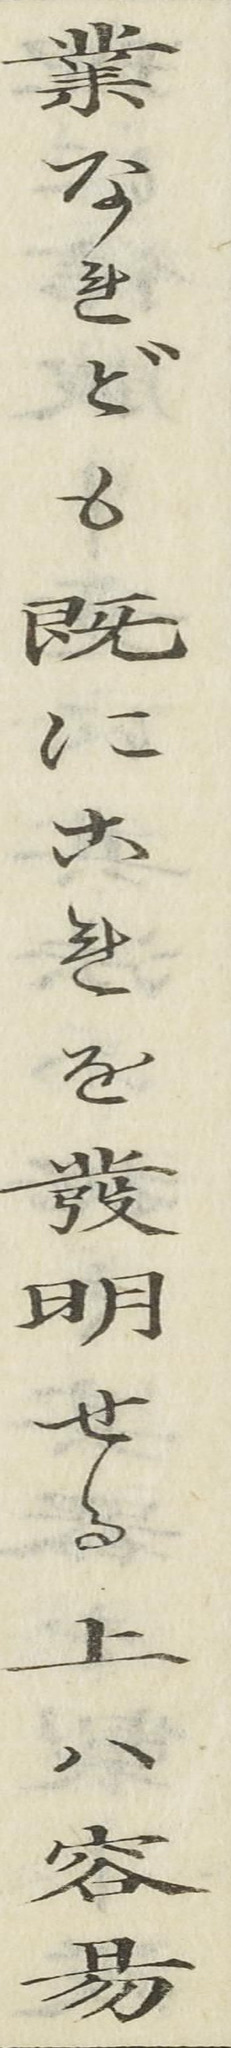業なれども既にこれを発明せる上は容易
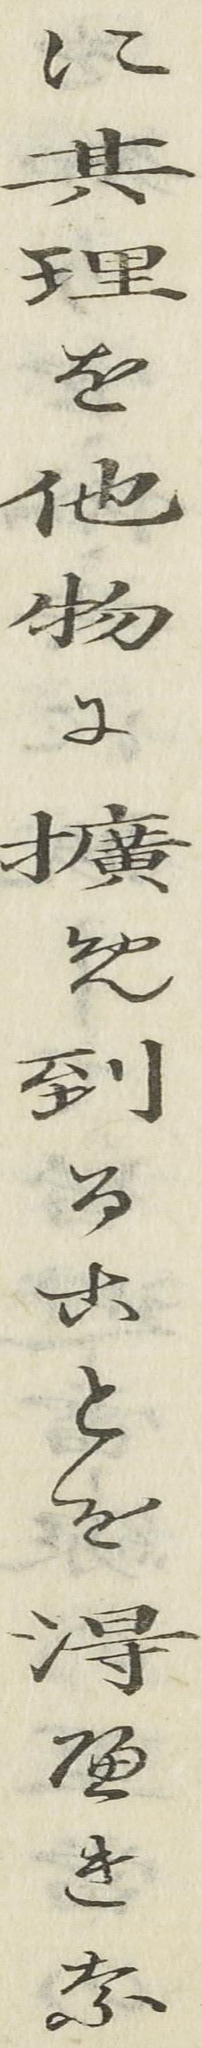に其理を他物に広め到ることを得べきな
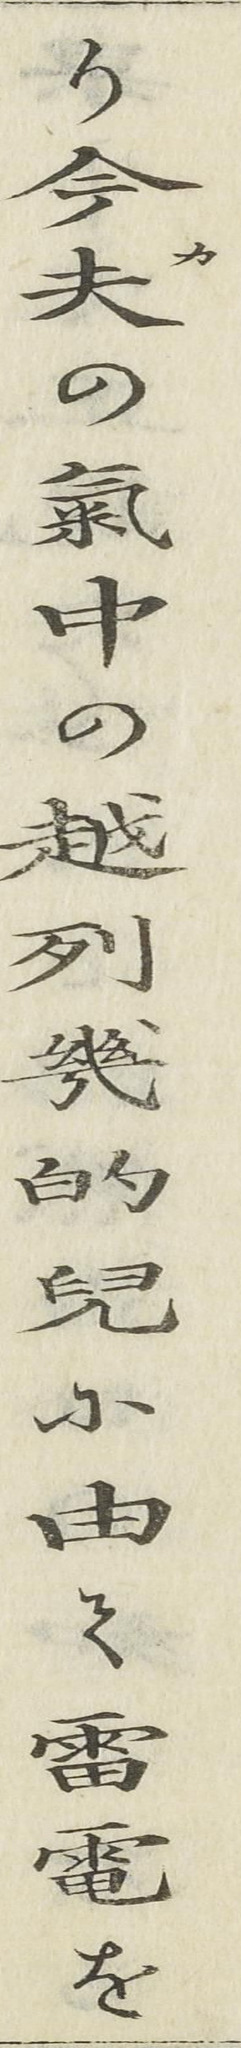り今か夫の気中の越列幾的児に由て雷電を
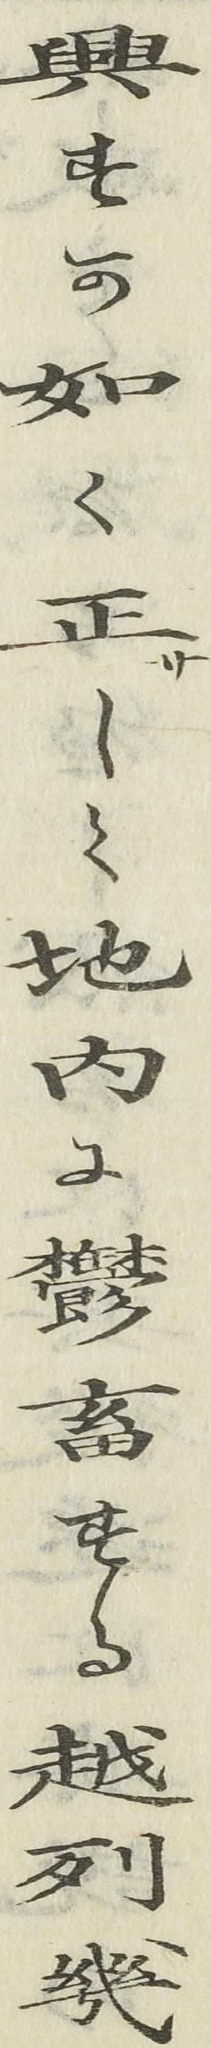興すが如く正さして地内に鬱畜する越列幾
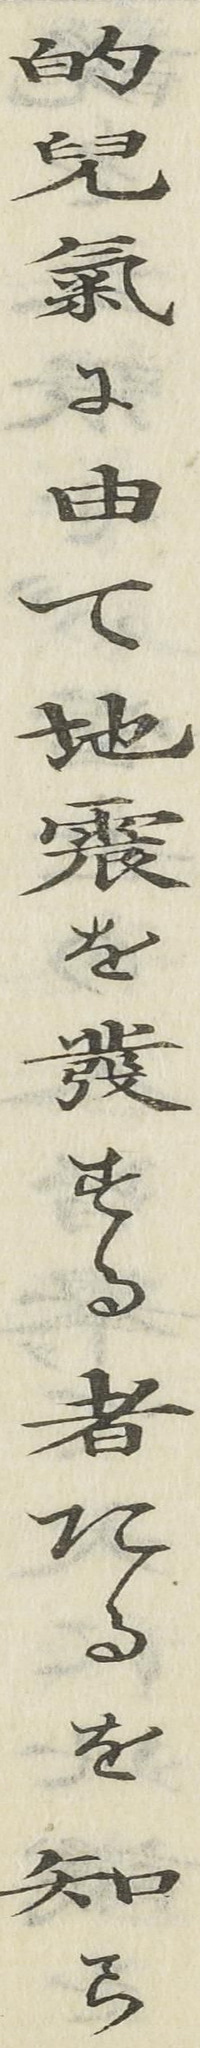的児気に由て地震を発する者たるを知ら
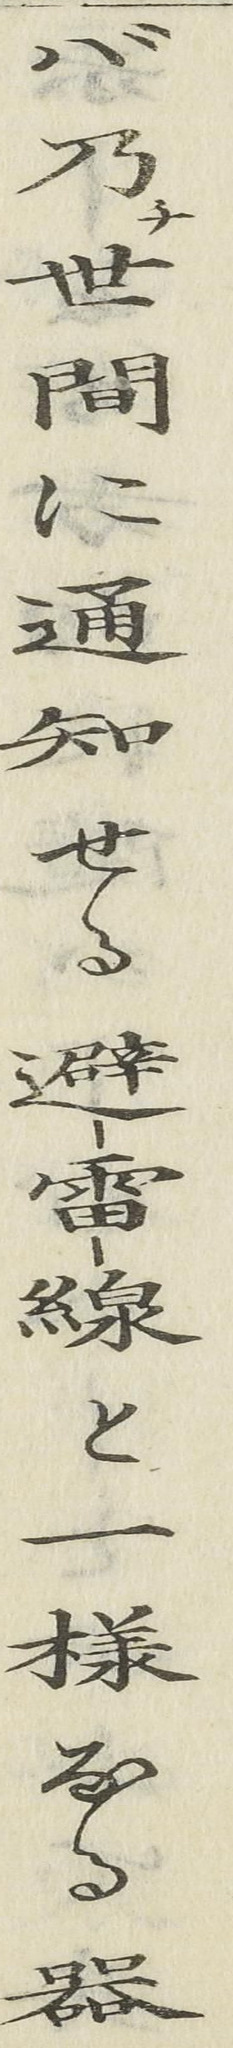ば乃ち世間に通知せる避雷線と一様なる器
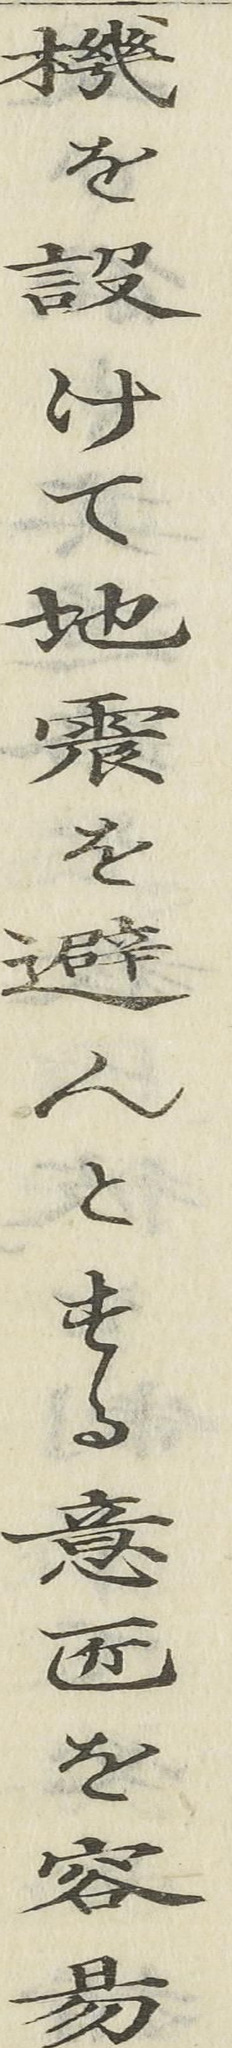機を設けて地震を避とする意匠を容易
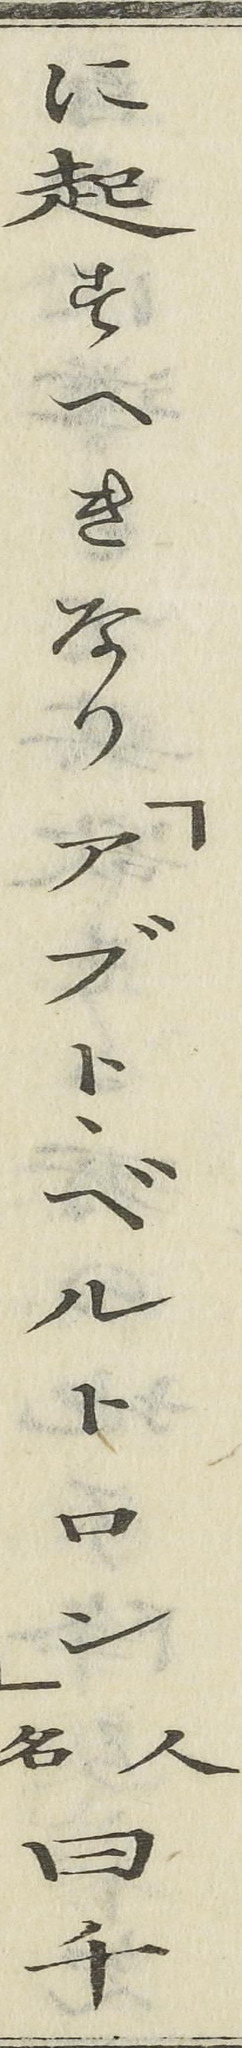に起すべきなり「アブド・ベルトロン」人名曰千
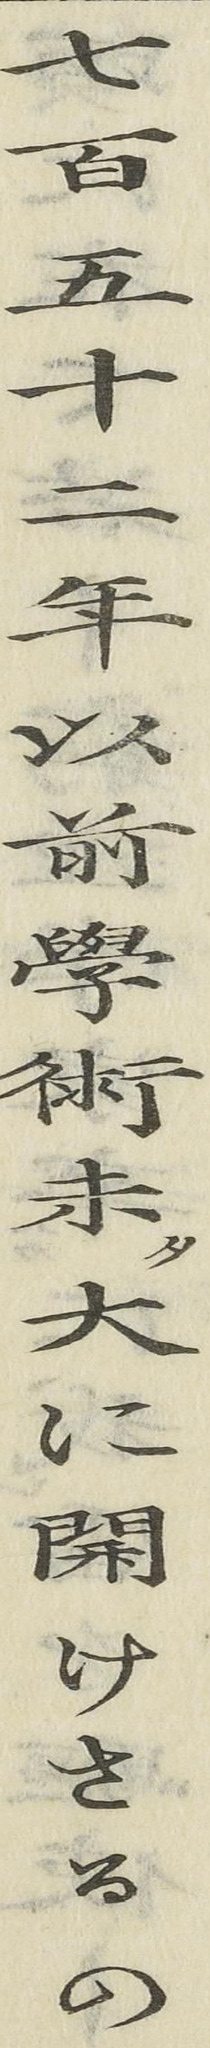七百五十二年以前学術未だ大に開けさるの

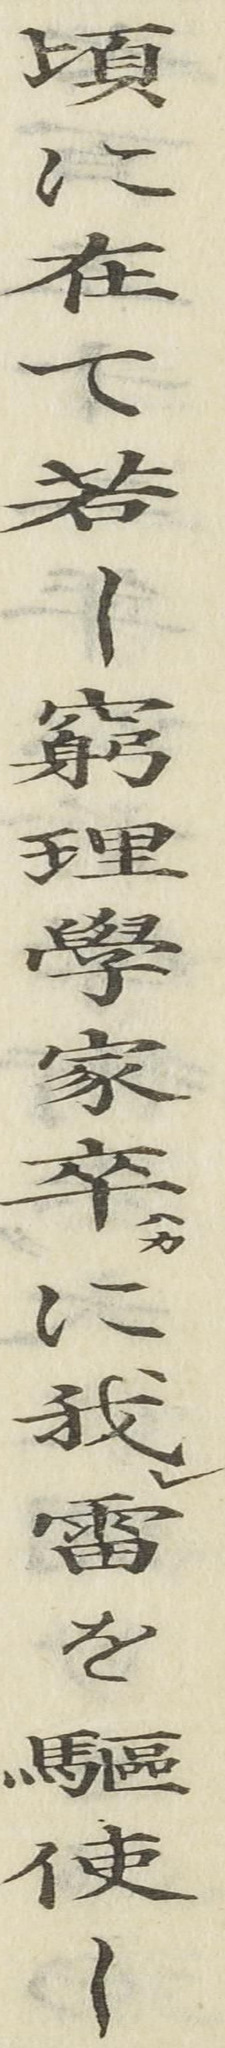頃に在て若し窮理学家卒はかに我れ雷を駆使し
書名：地震預防説
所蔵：東京大学地震研究所図書室 Earthquake Research Institute Library, The University of Tokyo, JAPAN
